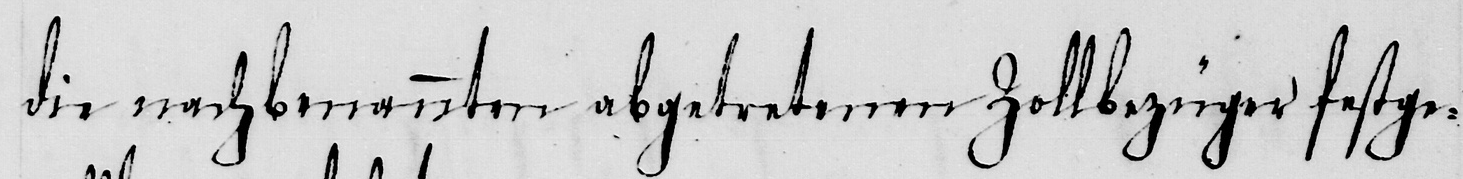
die nachbenannten abgetretenen Zollbezüger festges¬
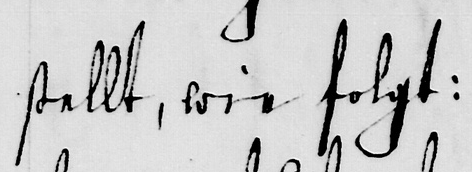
tellt, wie folgt:
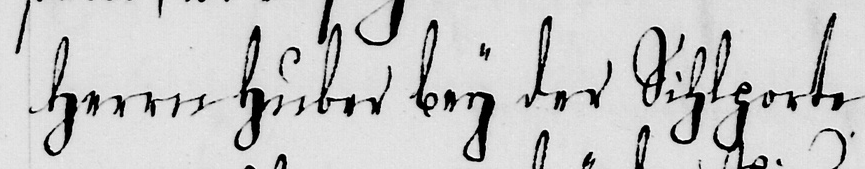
Herrn Huber bey der Sihlporte
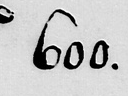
600.
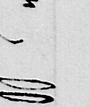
“
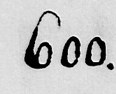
600.
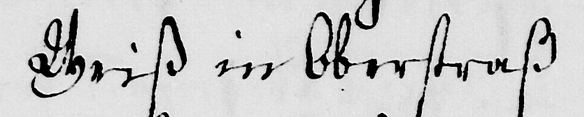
Weiß in Oberstraß
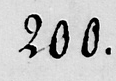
200.
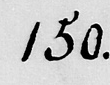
150.
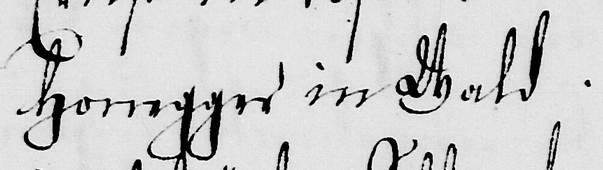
Honegger in Wald
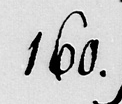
160.
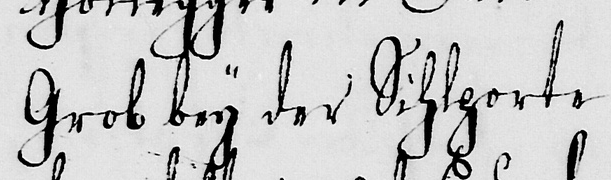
Grob bey der Sihlporte
